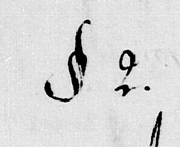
§. 2.
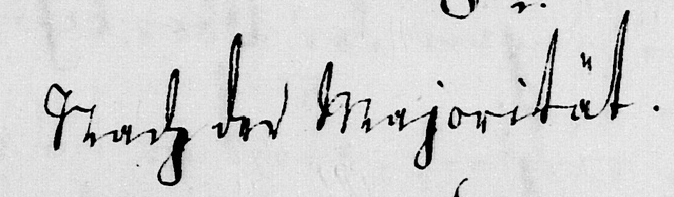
Nach der Majorität.
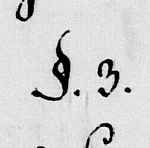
§. 3.
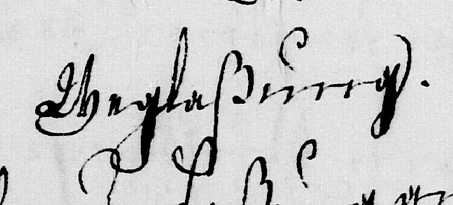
Weglaßung.
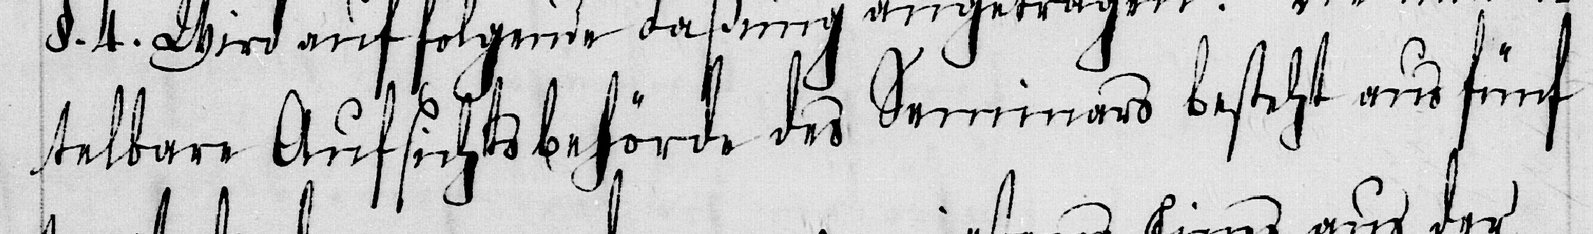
telbare Aufsichtsbehörde des Seminars besteht aus fünf
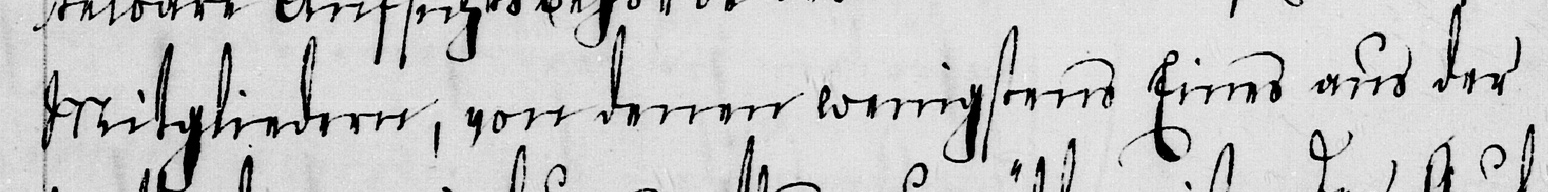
Mitgliedern, von denen wenigstens Eines aus der
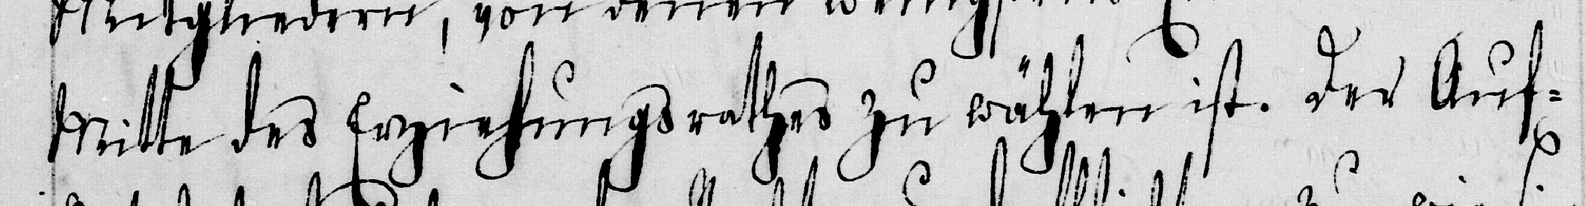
Mitte des Erziehungsrathes zu wählen ist. Der Auf¬
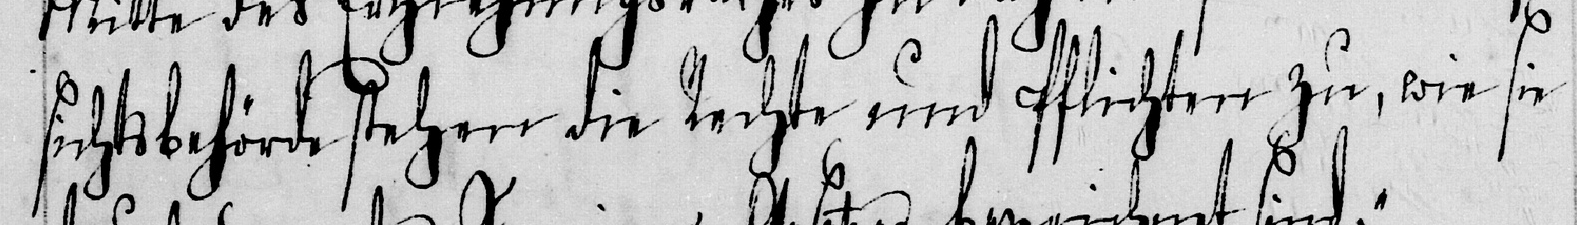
sichtsbehörde stehen die Rechte und Pflichten zu, wie sie
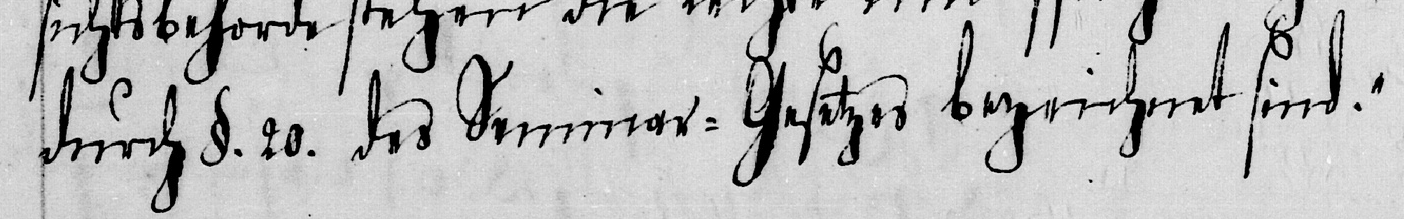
durch §. 20. des Seminar-Gesetzes bezeichnet sind.“
